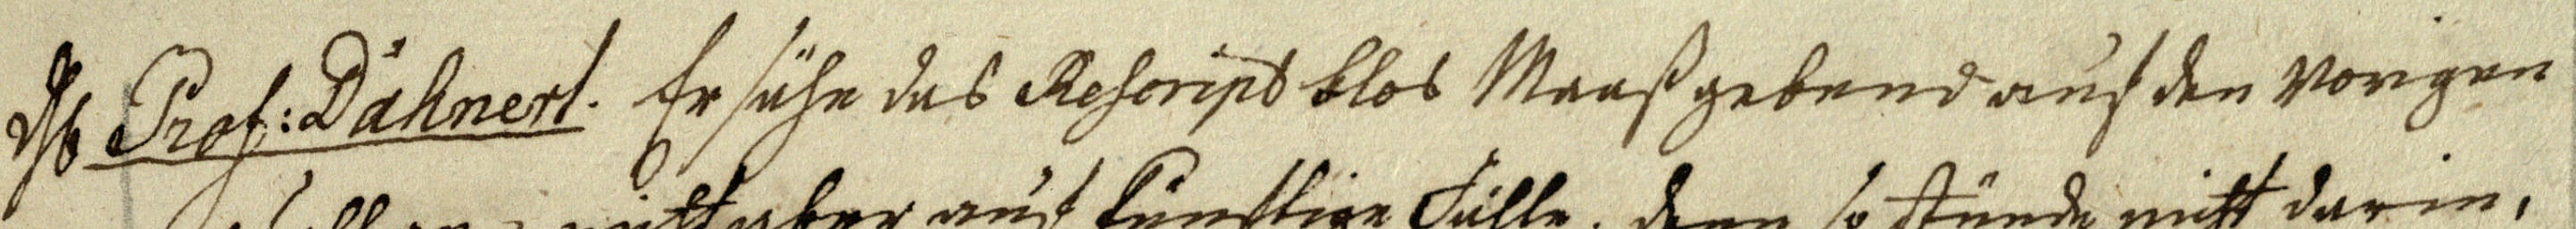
dh. Prof. Dähnert. Er sähe das Rescript blos Maaß gebend auf den vorigen
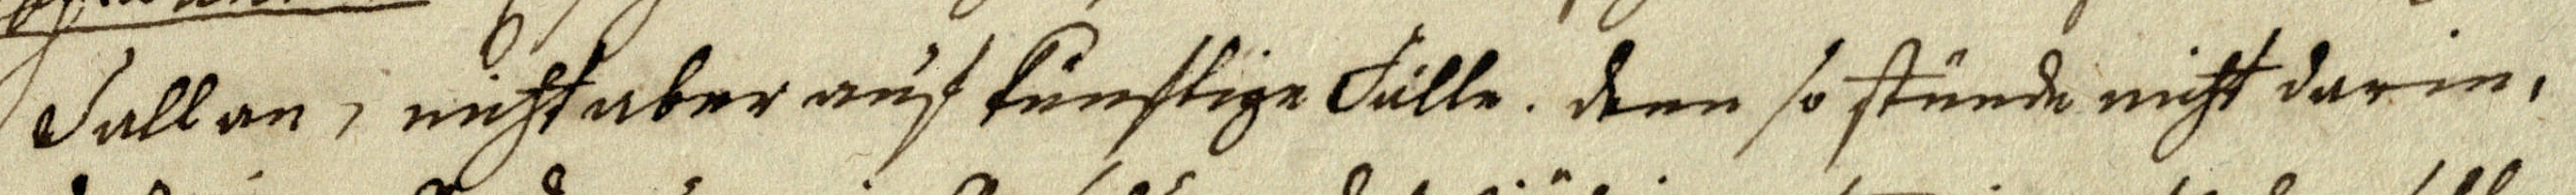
Fall an, nicht aber auf künftige Fälle. Denn so stünde nicht darin,
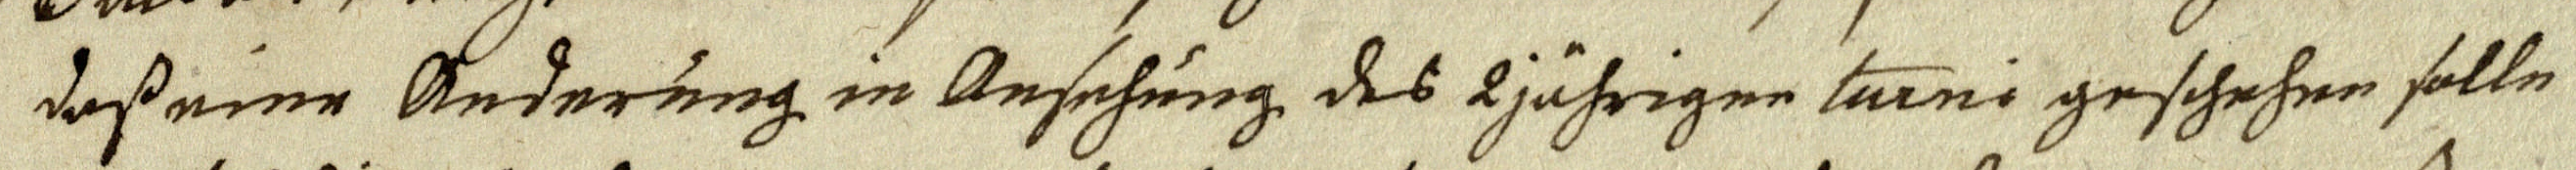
daß eine Anderung in Ansehung des 2jährigen turni geschehen solle
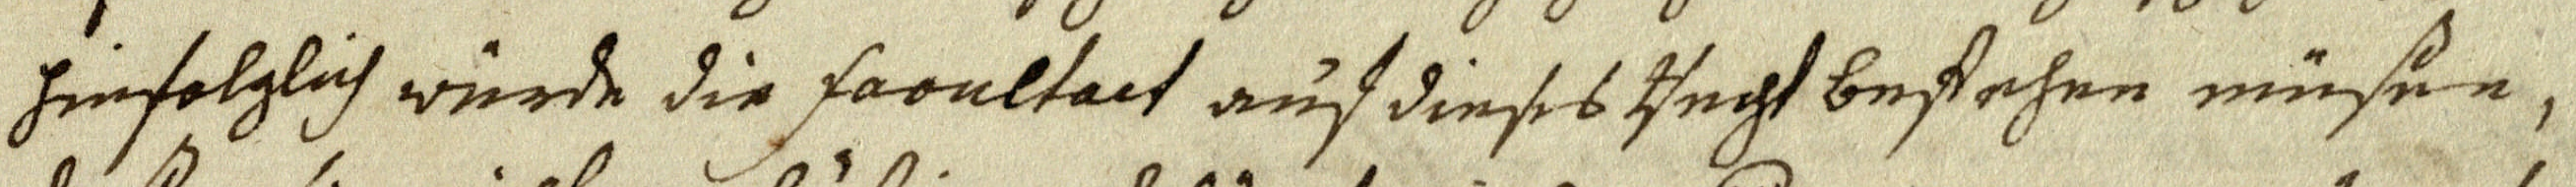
hinfolglich würde die facultaet auf dieses Recht bestehen müßen,
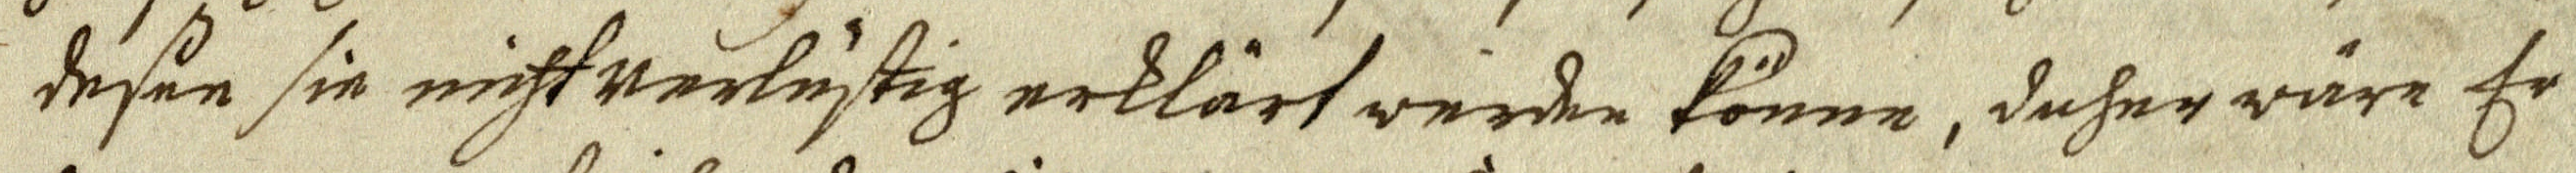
deßen sie nicht verlustig erklärt werden könne, daher wäre Er
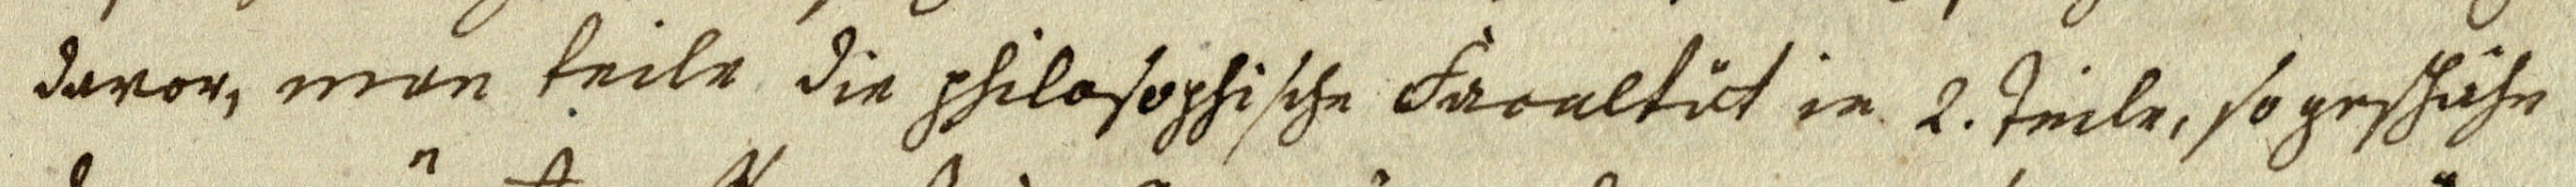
davor, man teile die philosophische facultät in 2 Teile, so geschähe
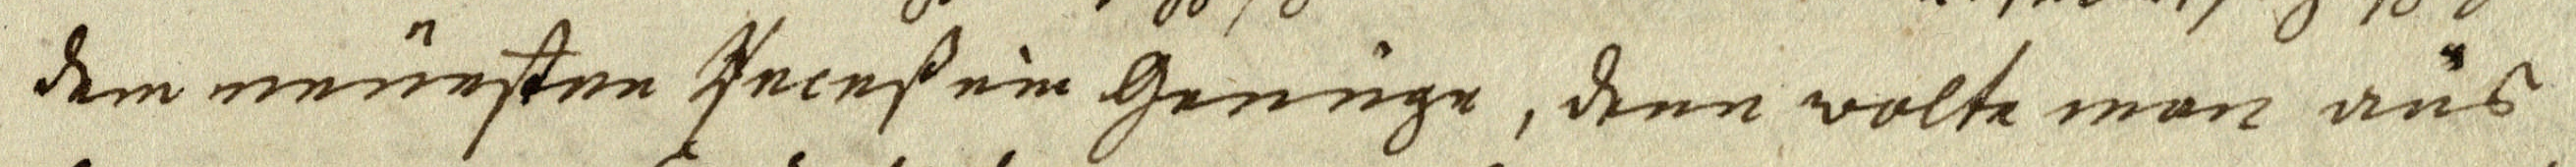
dem neuesten Receß ein Genüge, denn wolte man aus
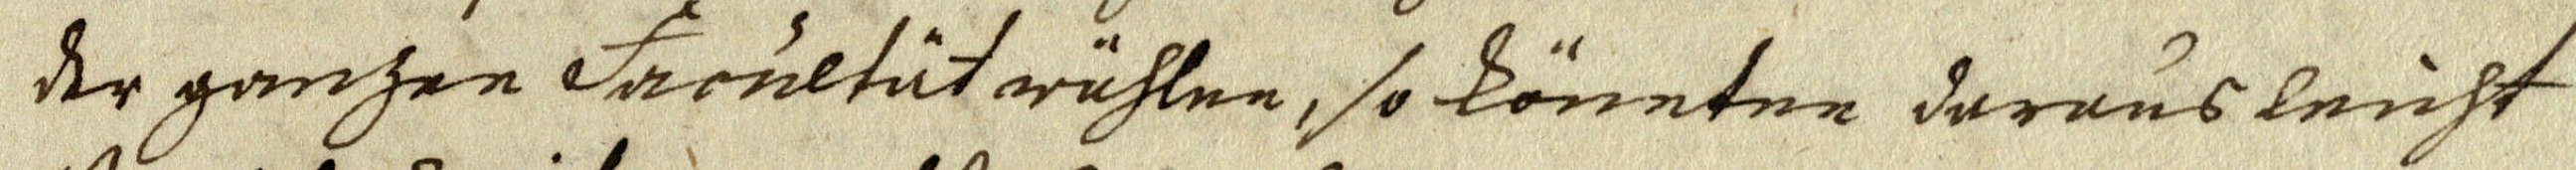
der ganzen Facultät wählen, so könnten daraus leicht
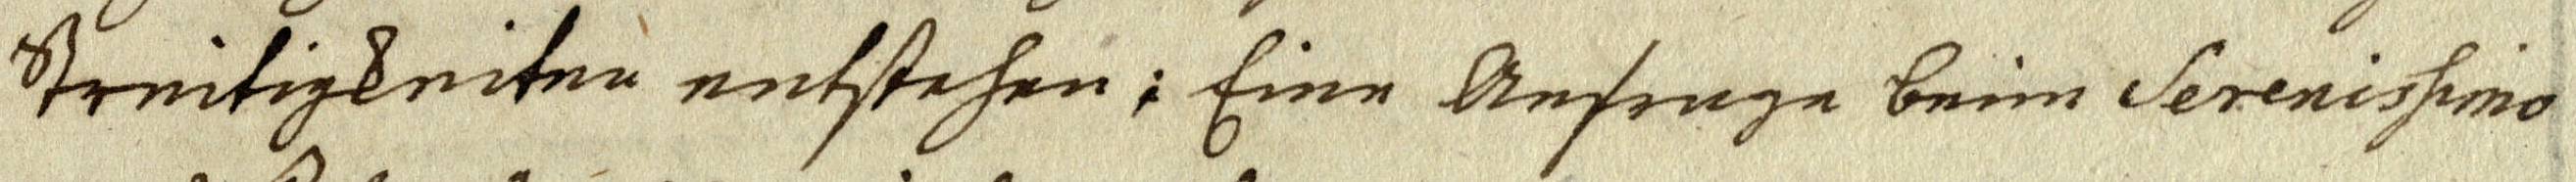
Streitigkeiten entstehen; Eine Anfrage beim Serenissimo
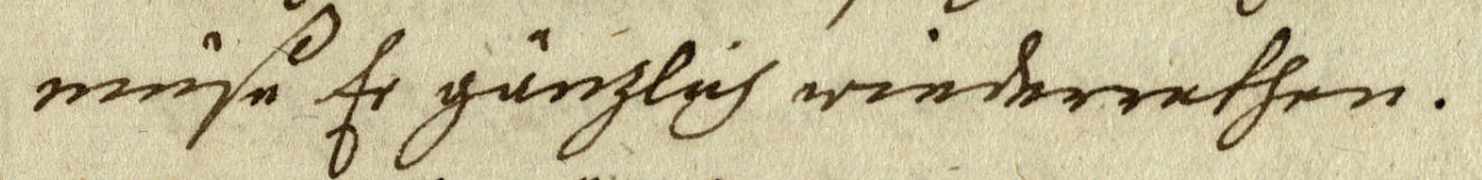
müße Er gänzlich wiederrathen.
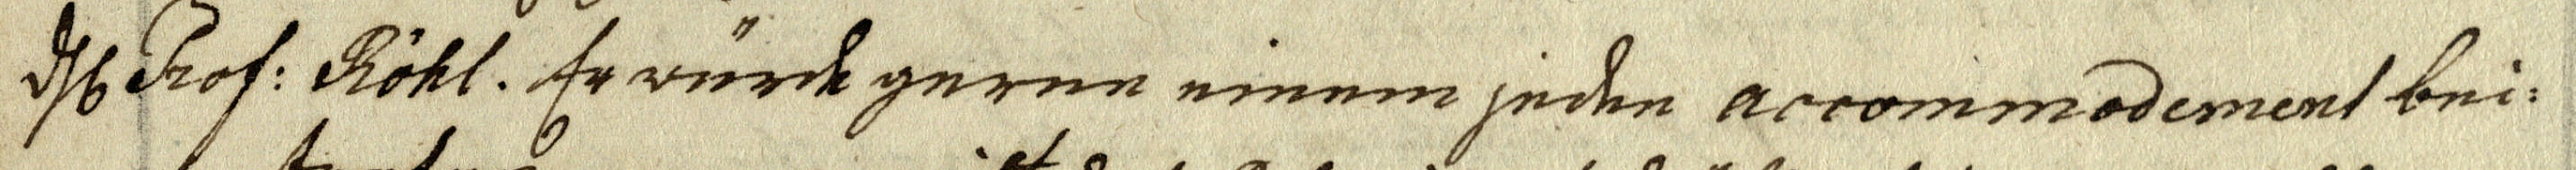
dh. Prof. Röhl. Er würde gerne einem jeden accommodement bei¬
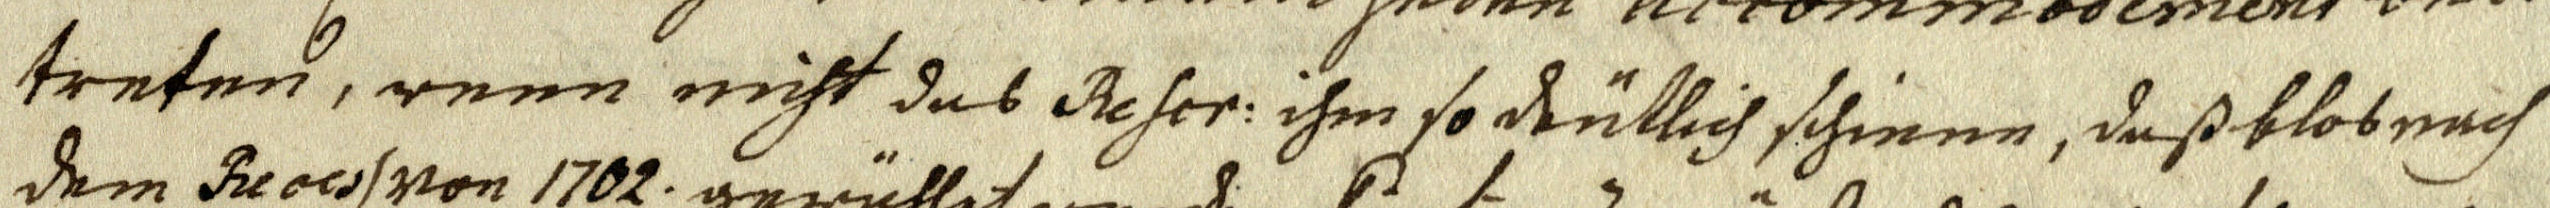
treten, wenn nicht das Rescr. ihm so deutlich schiene, daß blos nach
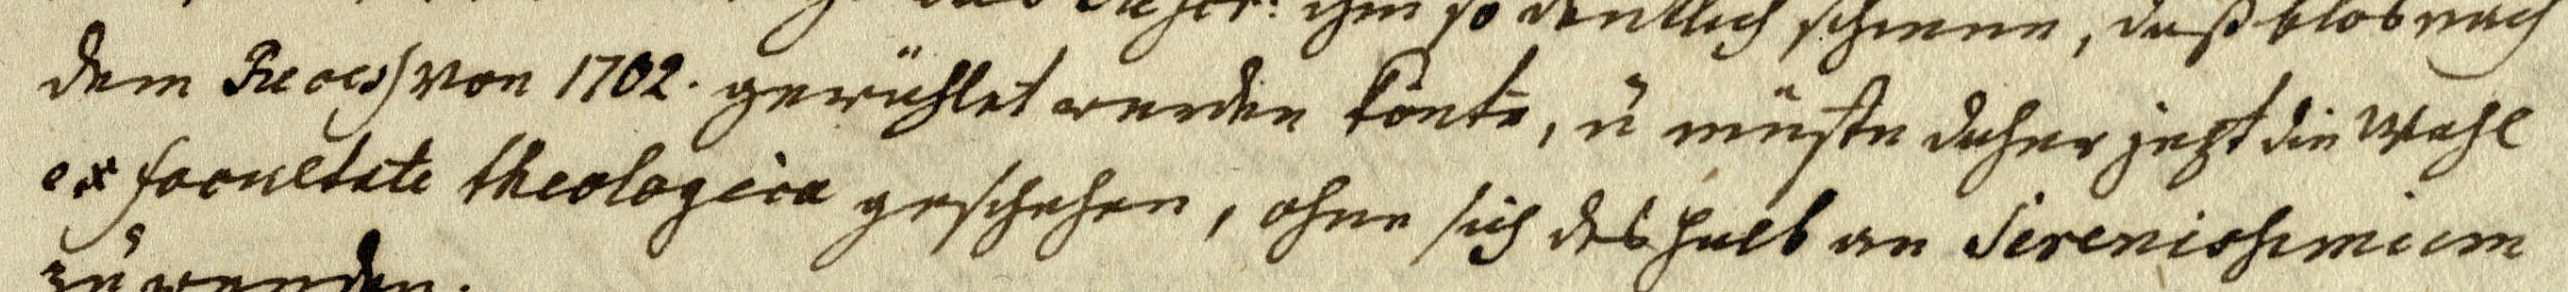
dem Recess von 1702. gewählet werden könte, u müste daher jezt die Wahl
